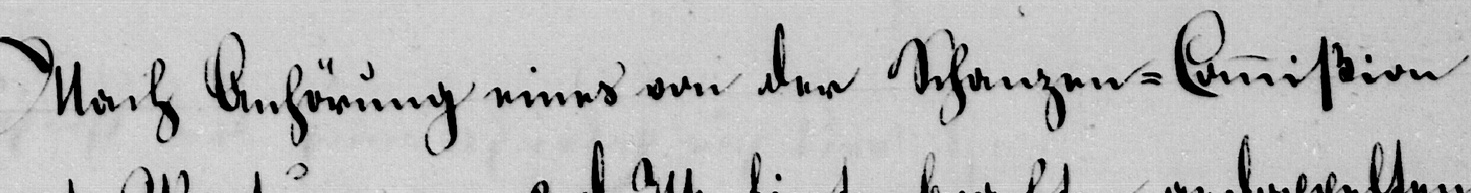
Nach Anhörung eines von der Schanzen-Commißion
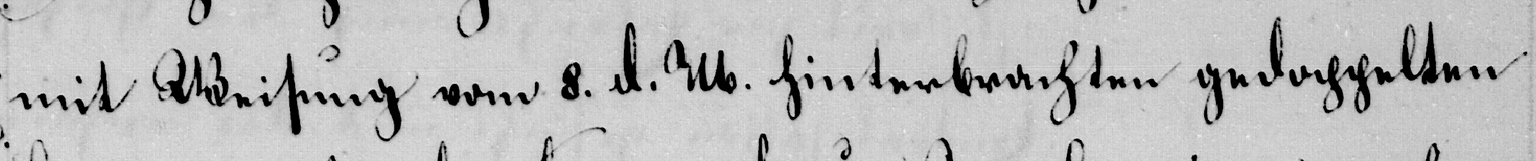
mit Weisung vom 8. d. M. hinterbrachten gedoppelten
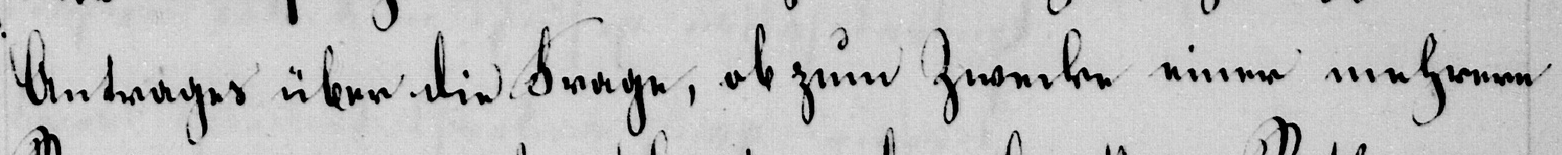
Antrages über die Frage, ob zum Zwecke einer mehrern
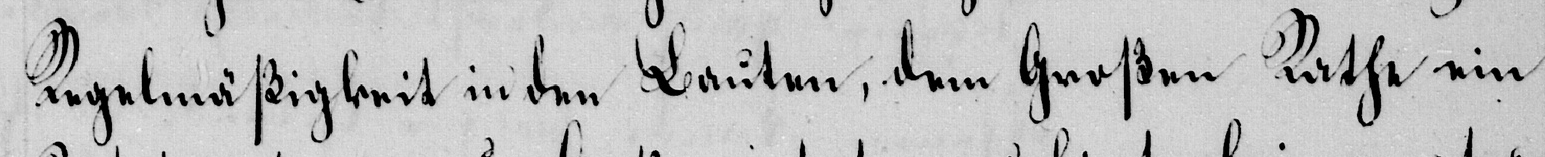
Regelmäßigkeit in den Bauten, dem Großen Rathe ein
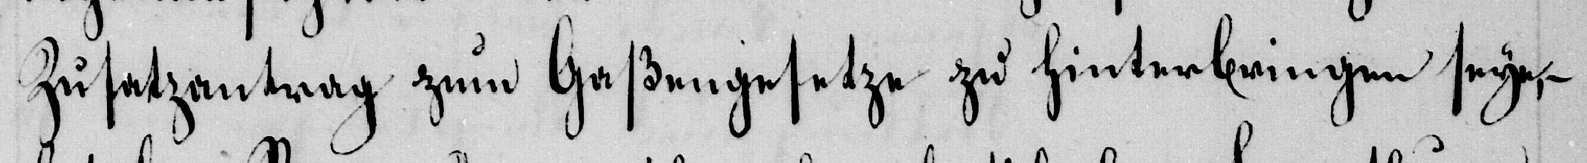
Zusatzantrag zum Gaßengesetze zu hinterbringen seye, –
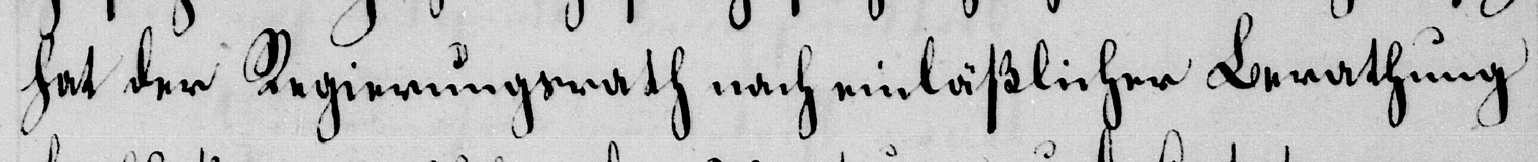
hat der Regierungsrath nach einläßlicher Berathung
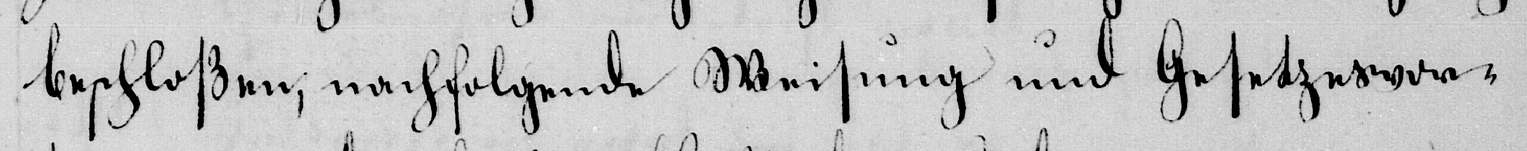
beschloßen, nachfolgende Weisung und Gesetzesvor¬
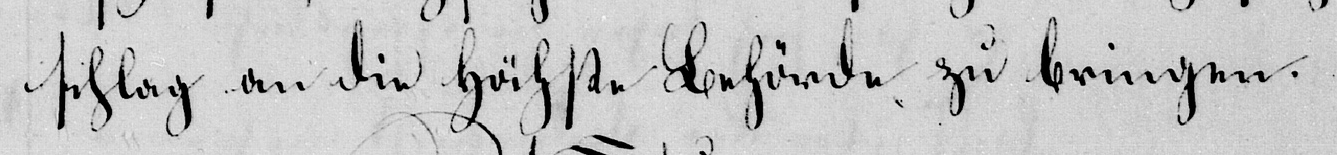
schlag an die Höchste Behörde zu bringen.
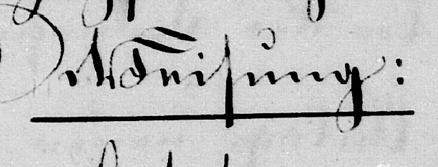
Weisung:
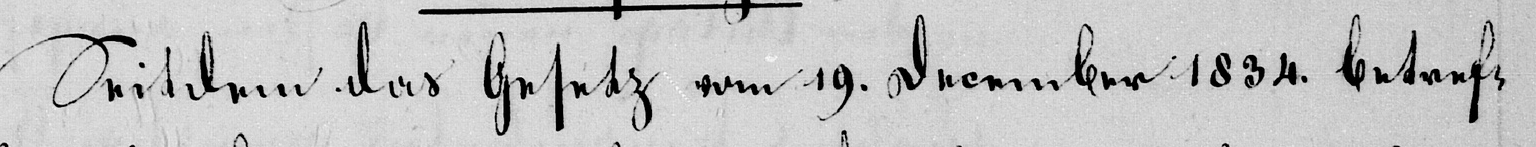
Seitdem das Gesetz vom 19. December 1834. betref¬
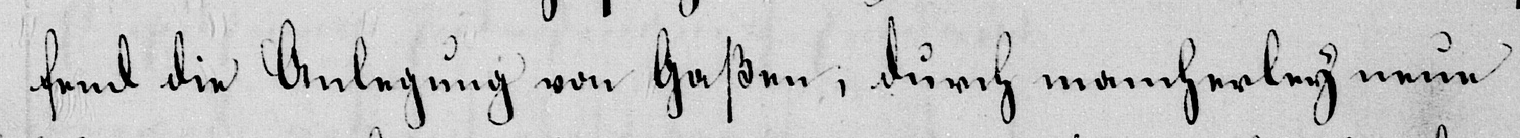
fend die Anlegung von Gaßen, durch mancherley neue
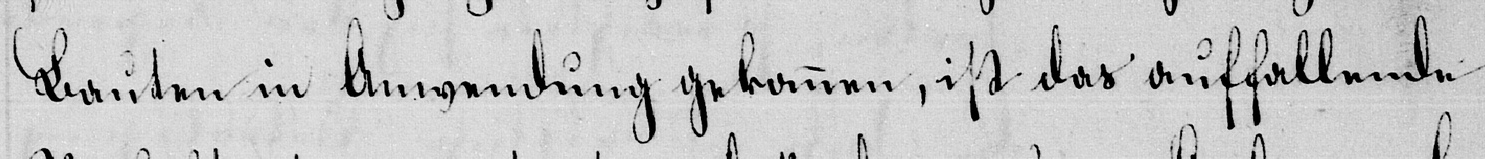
Bauten in Anwendung gekommen, ist das auffallende
